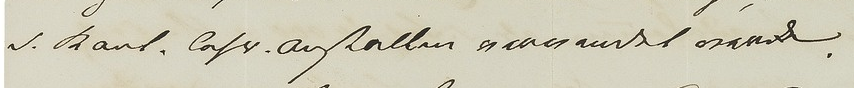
d. Kant.lehr-Anstalten verwendet werde.
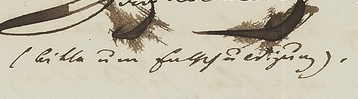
(bitte um Entschuldigung).
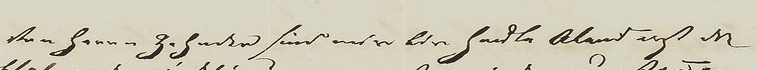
Von Herrn Zehnder sind mir bis heute Abend erst die
